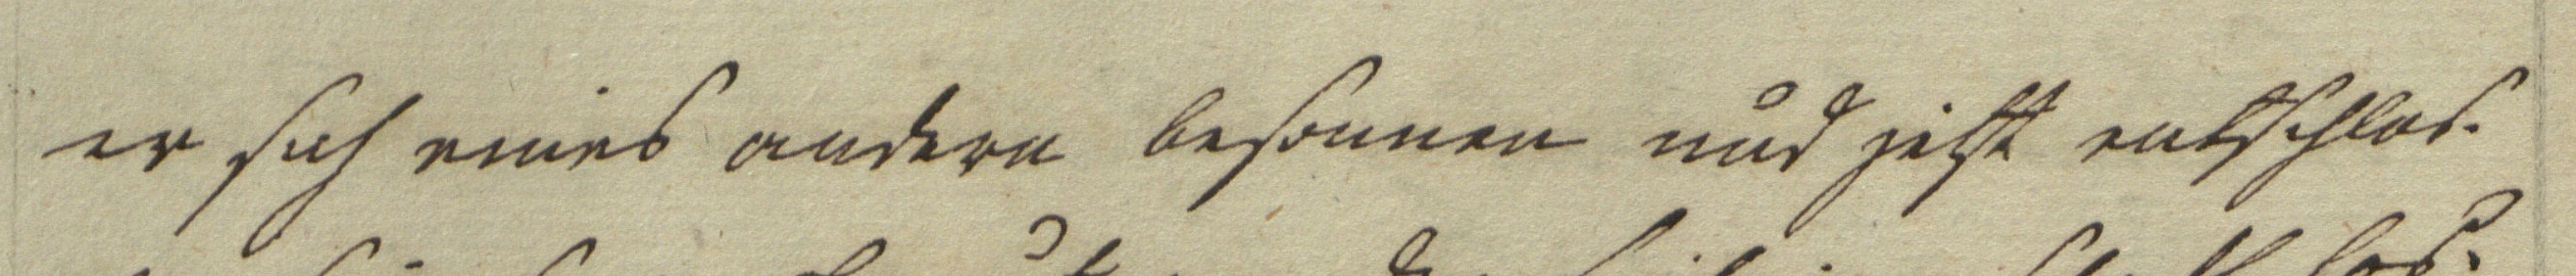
er sich eines andern besonnen und jetzt entschlos¬
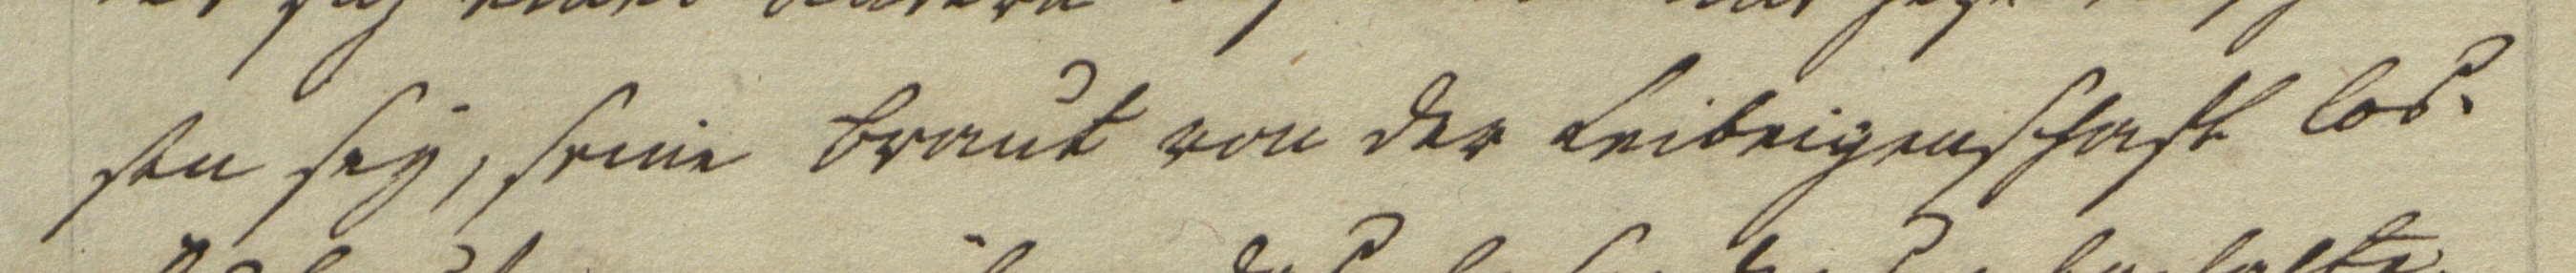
sen seÿ, seine Braut von der Leibeigenschaft los¬
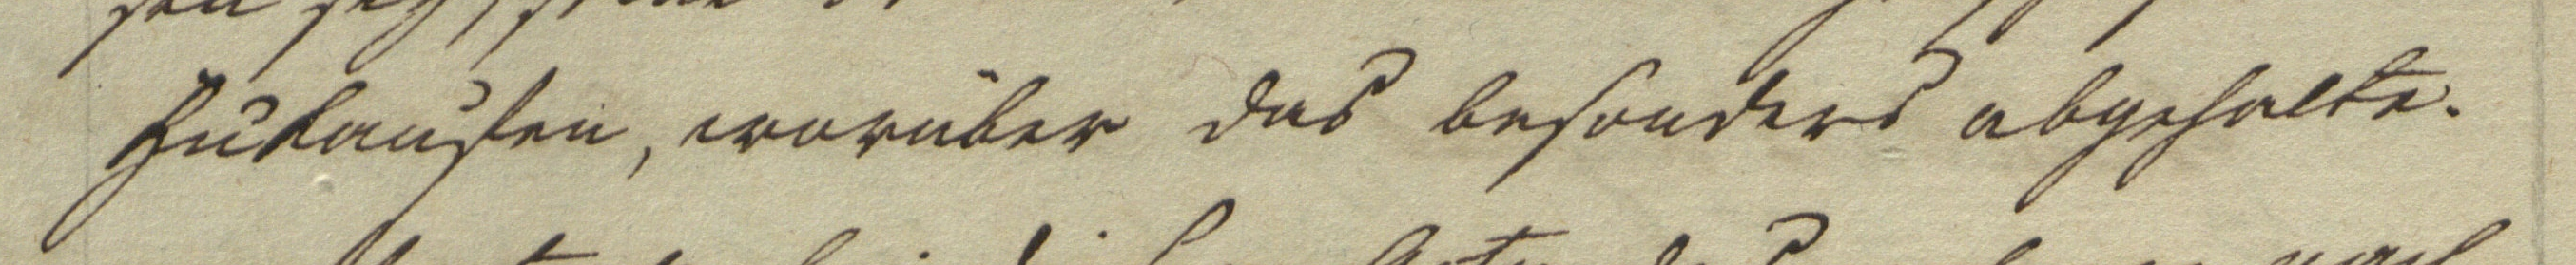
zukaufen, worüber das besonders abgehalte¬
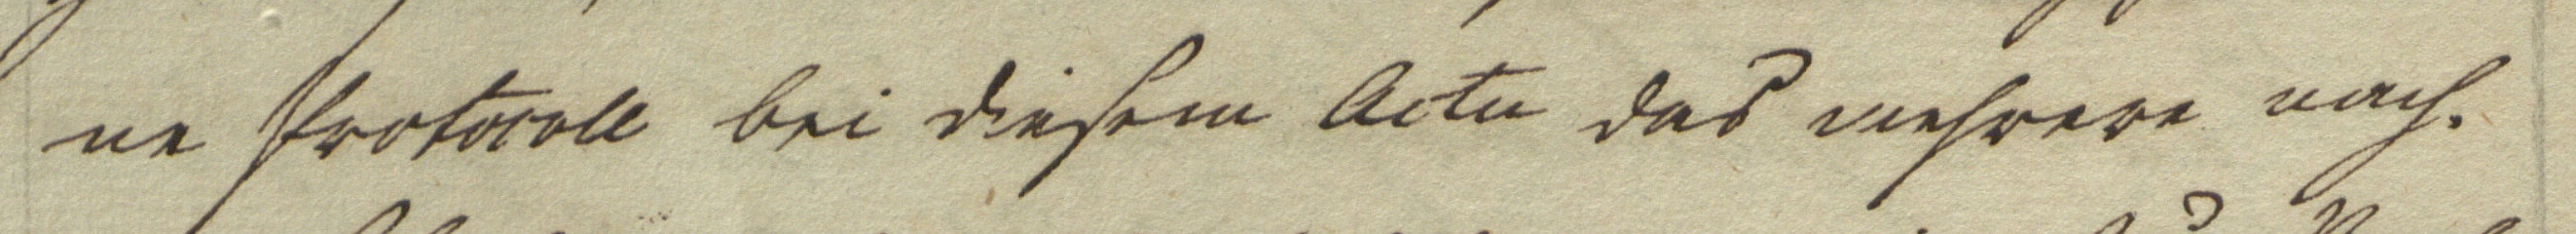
ne Protocoll bei diesem Actu das mehrere nach¬
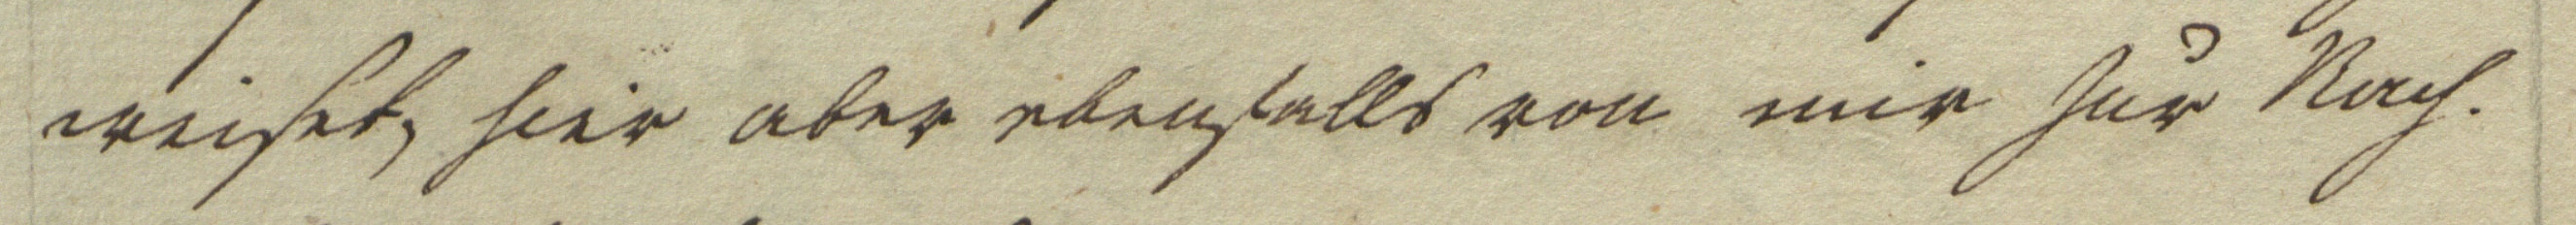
weiset, hier aber ebenfalls von mir zur Nach¬
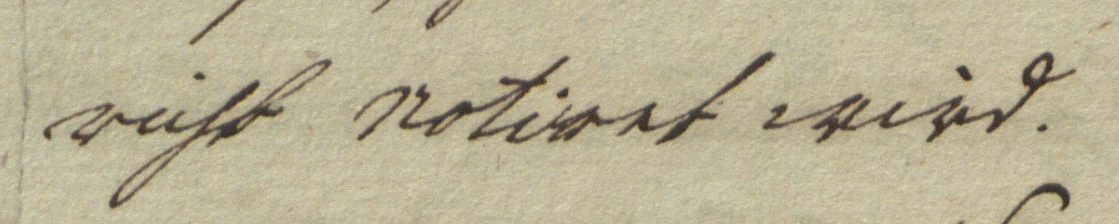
richt notiret wird.
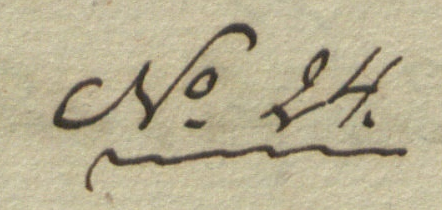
No 24.
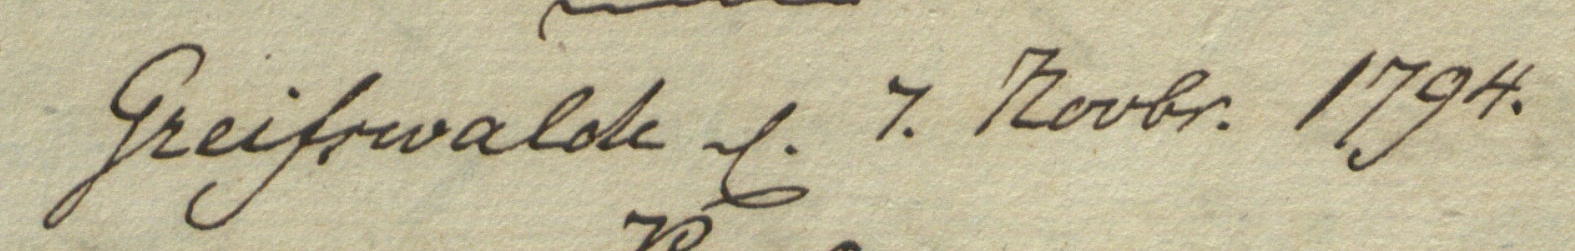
Greifswalde d. 7. Novbr. 1794.
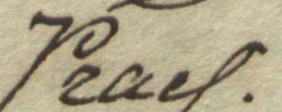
Praes.
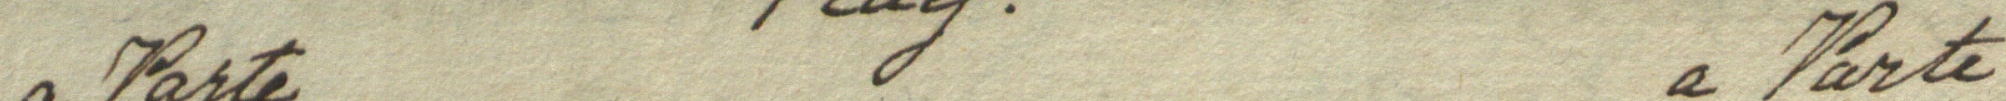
a Parte a Parte
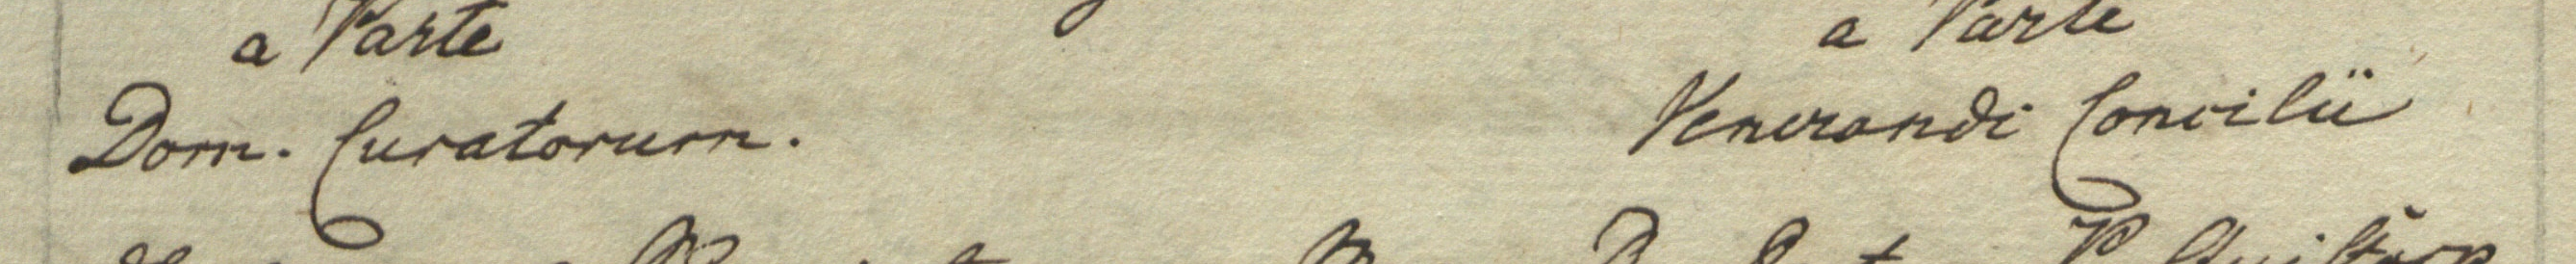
Dom. Curatorum. Venerandi Concilii
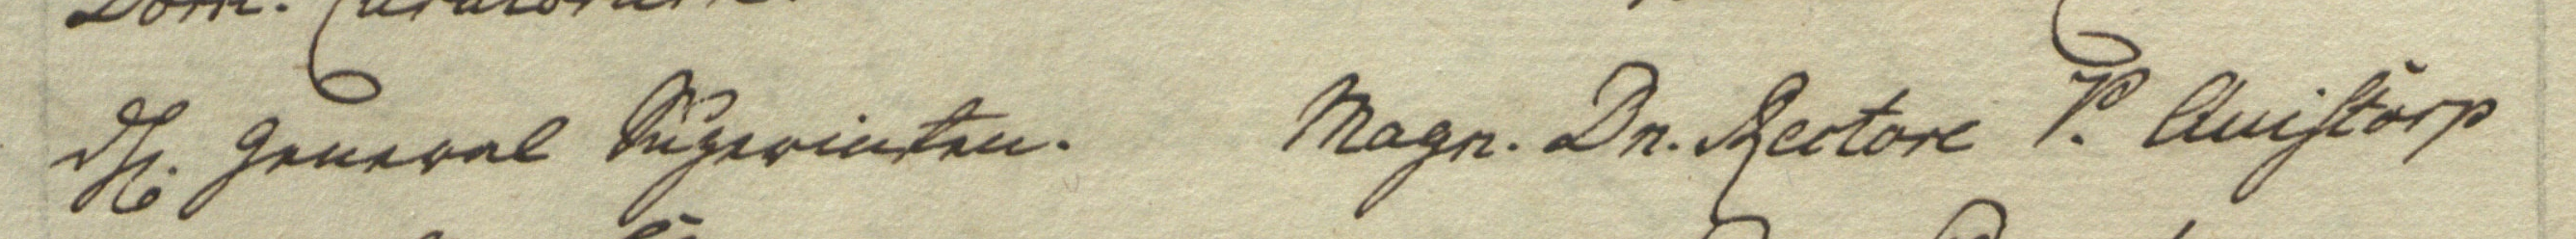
dh. General Superinten¬ Magn. Dn. Rector P. Quistorp
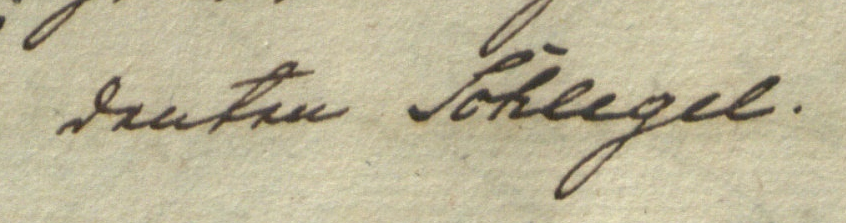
denten Schlegel.
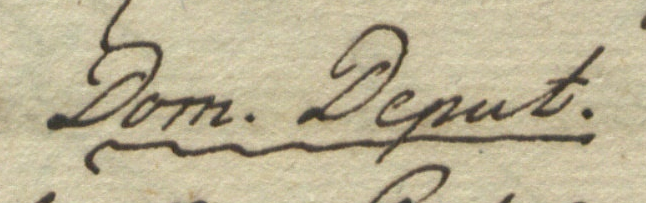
Dom. Deput.
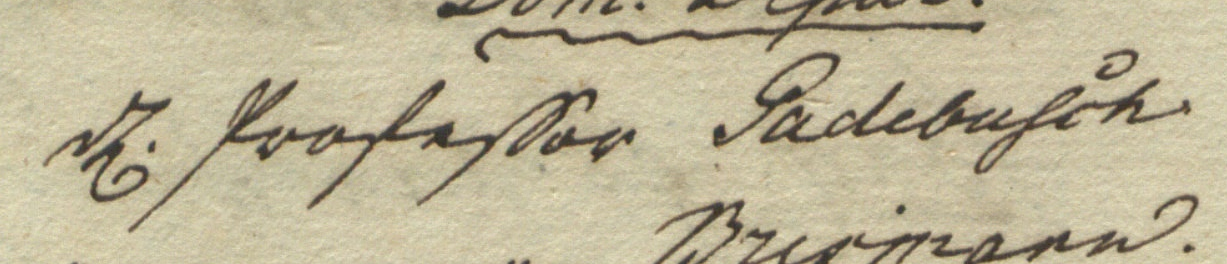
dh. Professor Gadebusch.
